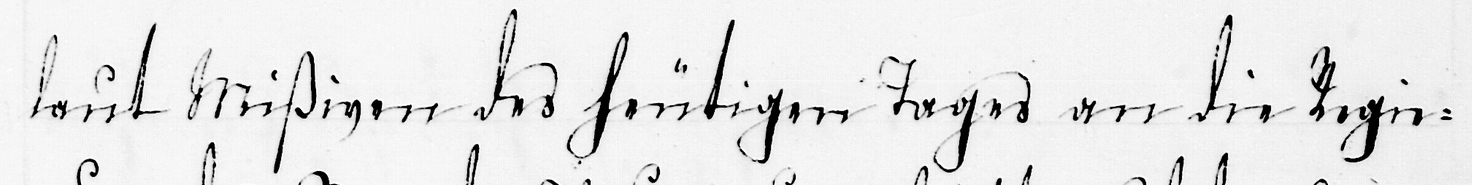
laut Mißiven des heutigen Tages an die Regie¬
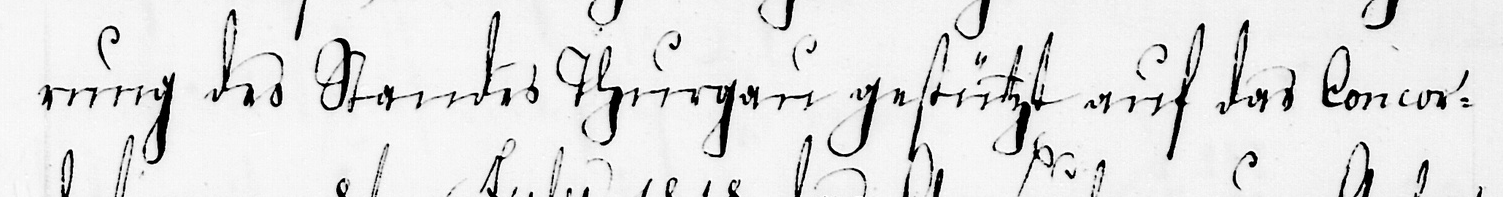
rung des Standes Thurgau gestützt auf das Concor¬
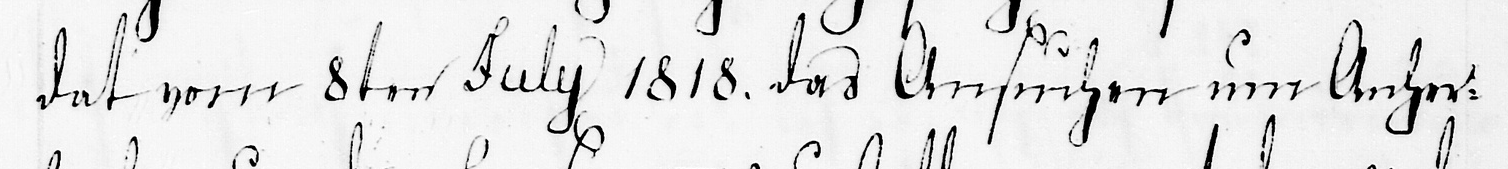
dat vom 8ten July 1818. das Ansuchen um Anher¬
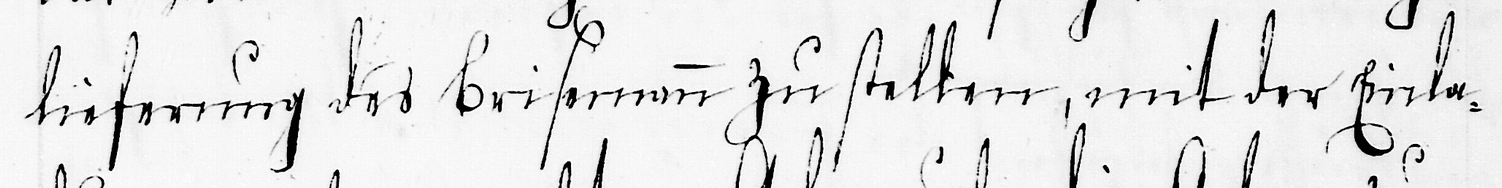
lieferung des Brisemann zu stellen, mit der Einla¬
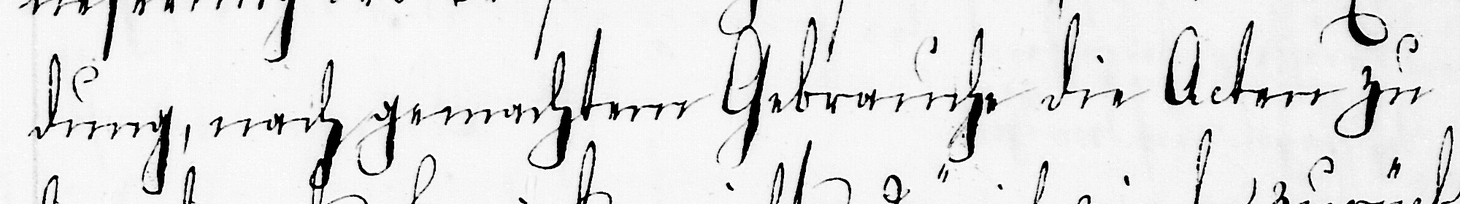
dung, nach gemachtem Gebrauche die Acten zu
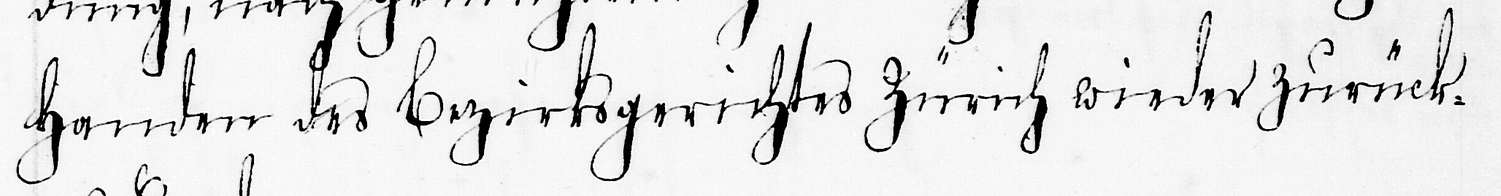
Handen des Bezirksgerichtes Zürich wieder zurück¬
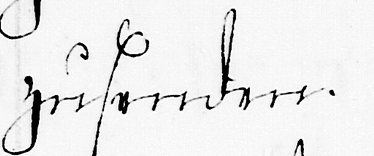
zusenden.
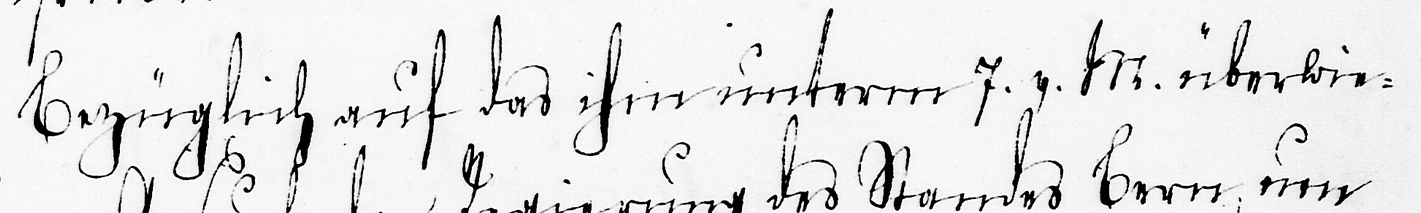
Bezüglich auf das ihm unterm 7. v. M. überwies¬
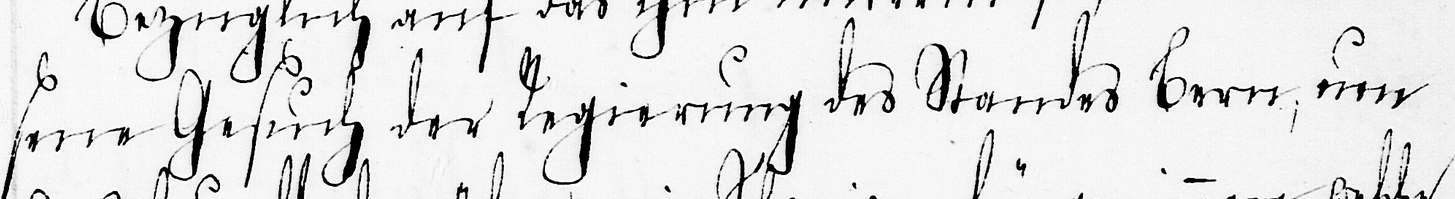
ene Gesuch der Regierung des Standes Bern, um
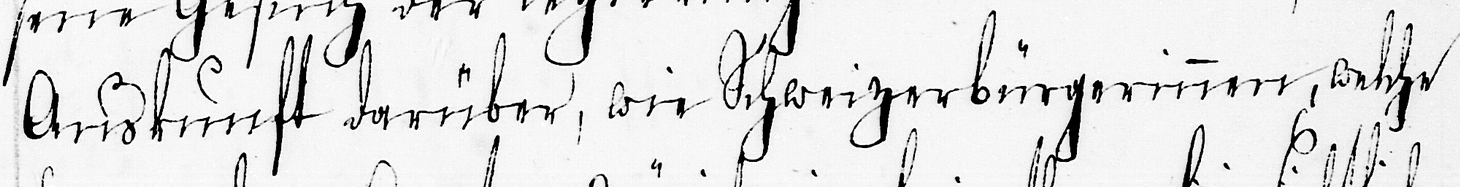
Auskunft darüber, wie Schweizerbürgerinnen, welche
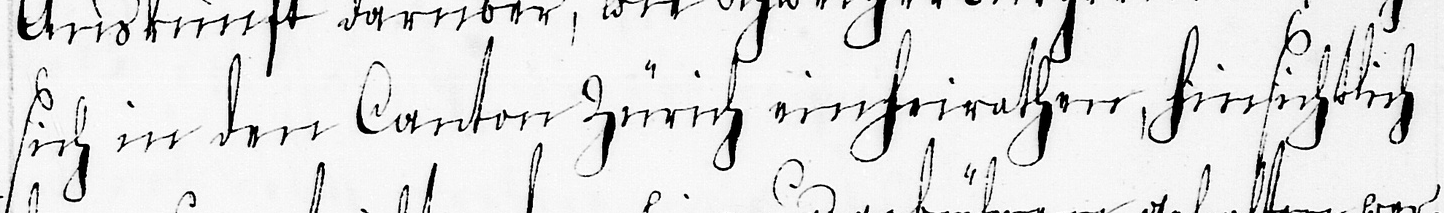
sich in den Canton Zürich einheirathen, hinsichtlich
